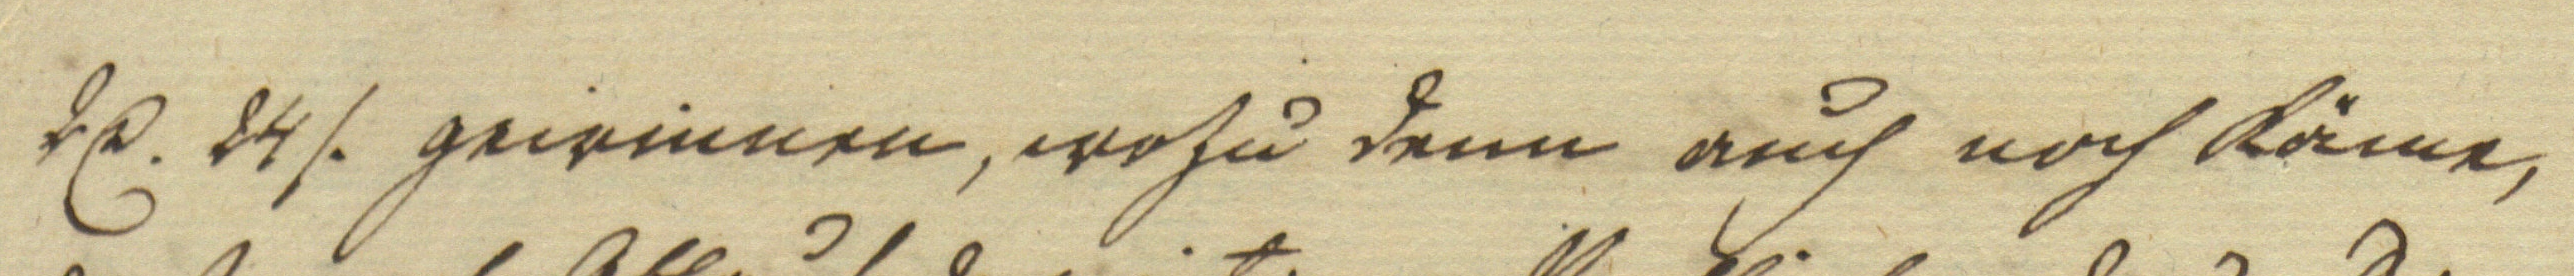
2 l. 24 s. gewinnen, wozu denn auch noch käme,
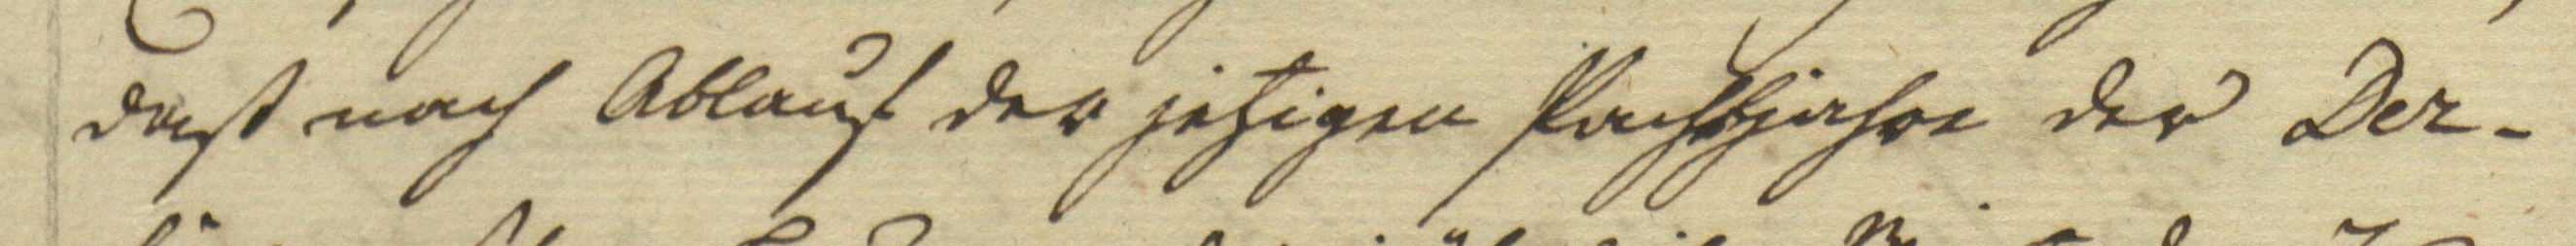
daß nach Ablauf der jetzigen Pachtjahre der Der¬
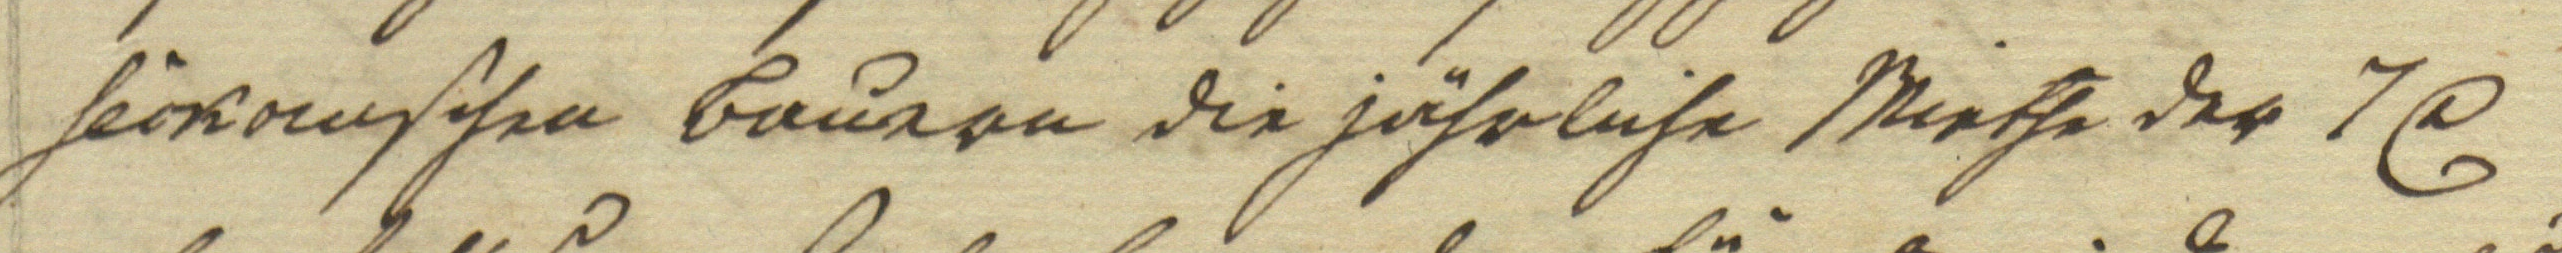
seckowschen Bauern die jährliche Miethe der 7 l.
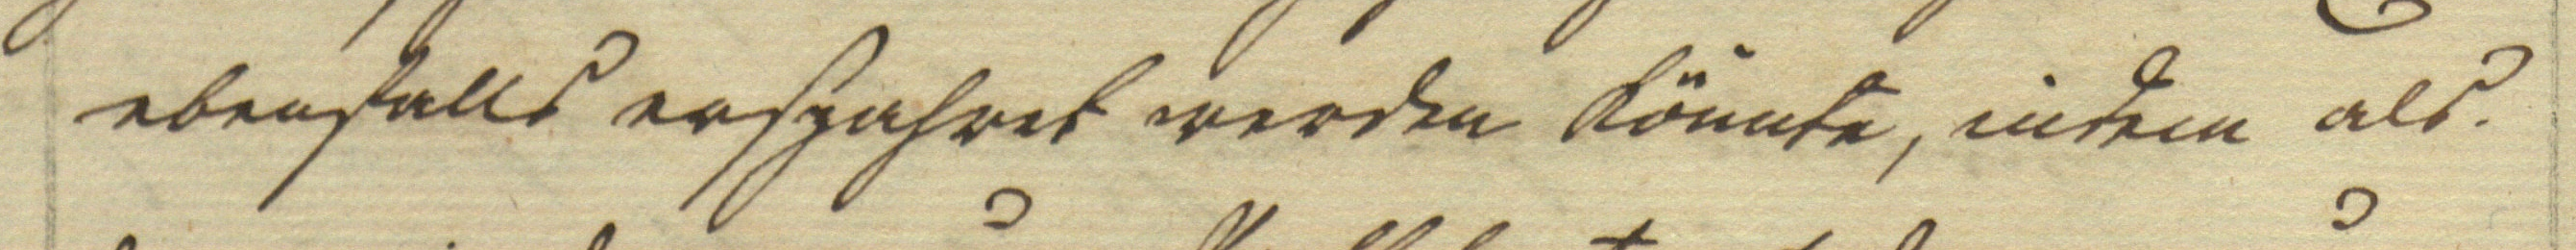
ebenfalls erspahret werden könnte, indem als¬
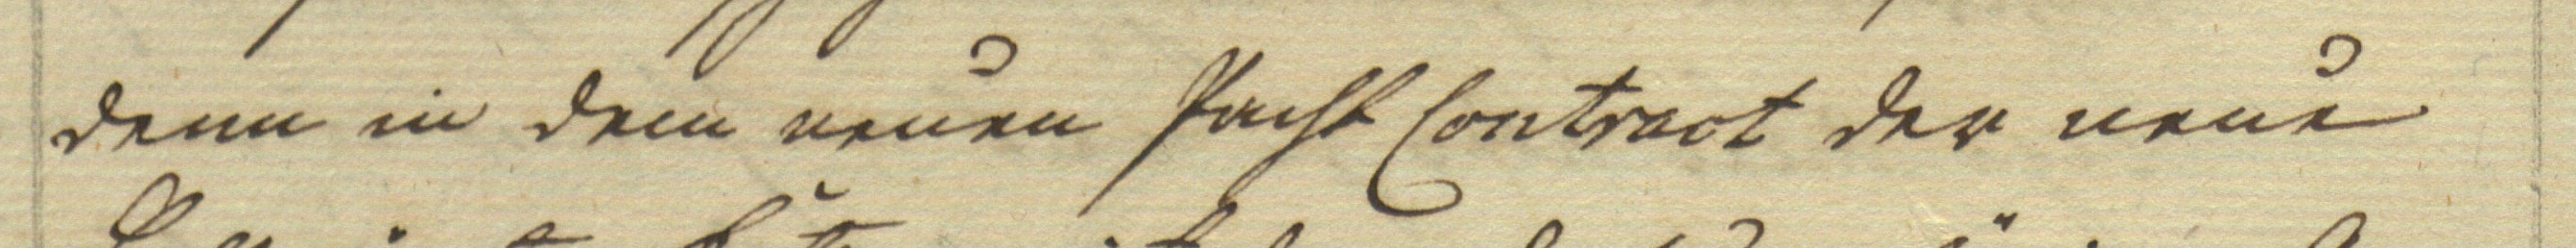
denn in dem neuen Pacht Contract der neue
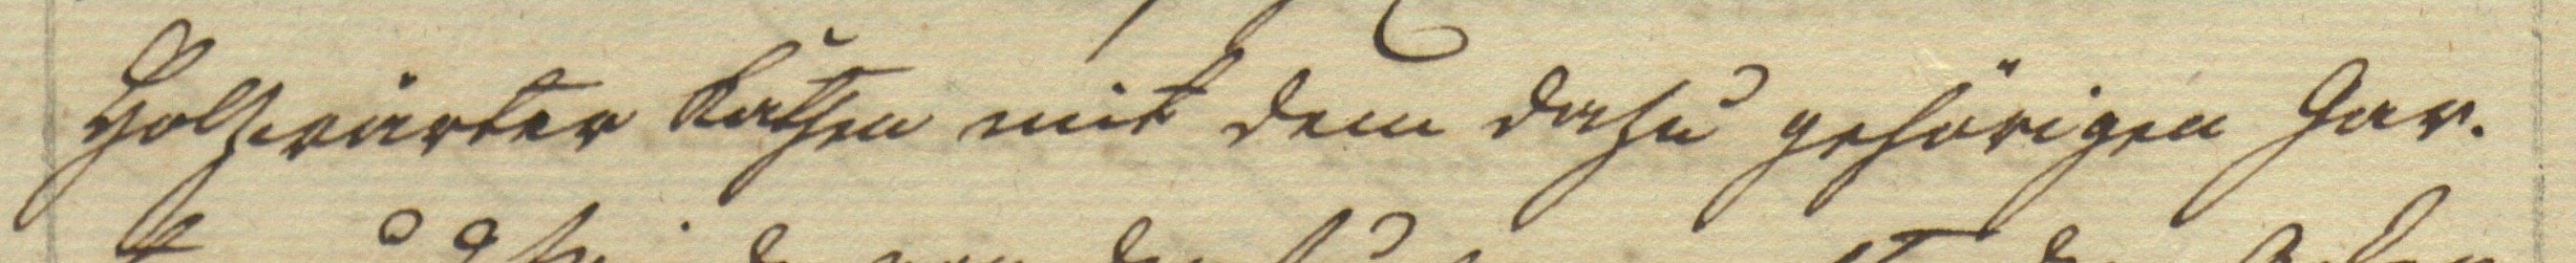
Holzwärter Kathen mit dem dazu gehörigen Gar¬
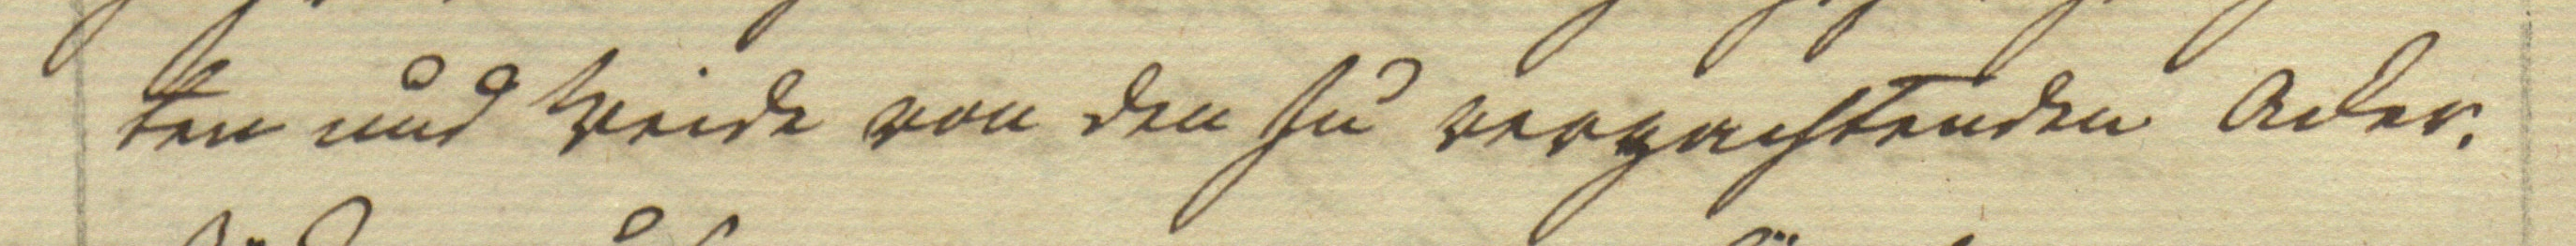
ten und Weide von den zu verpachtenden Acker¬
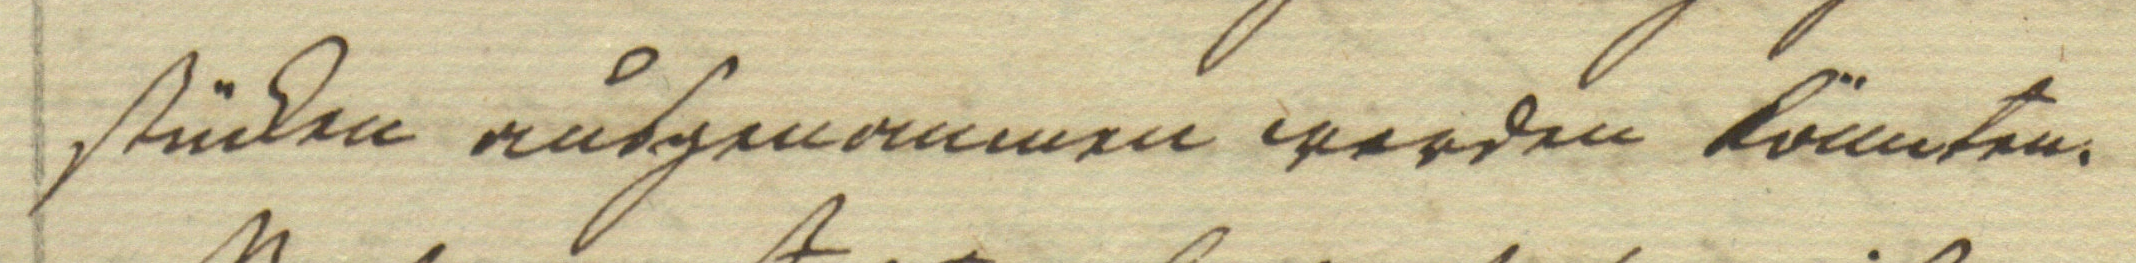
stücken aufgenommen worden könnten.
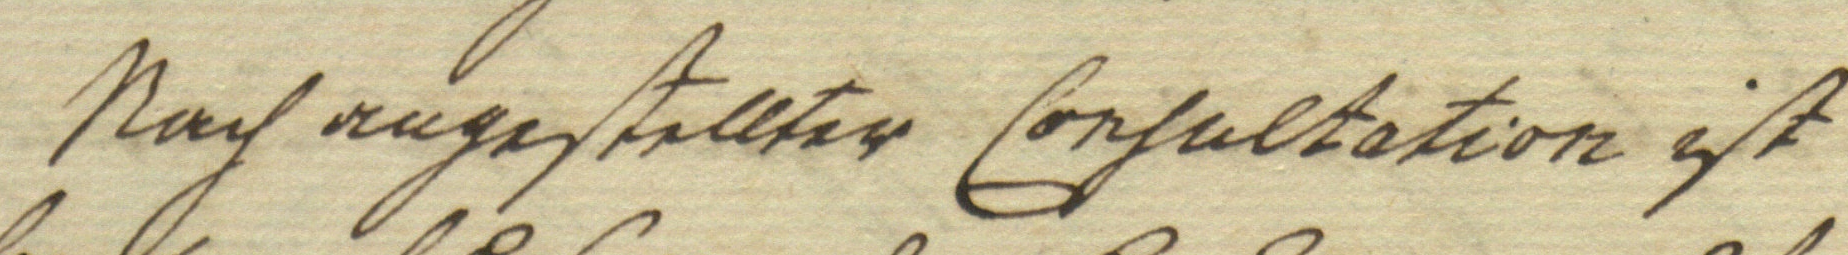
Nach angestellter Consultation ist
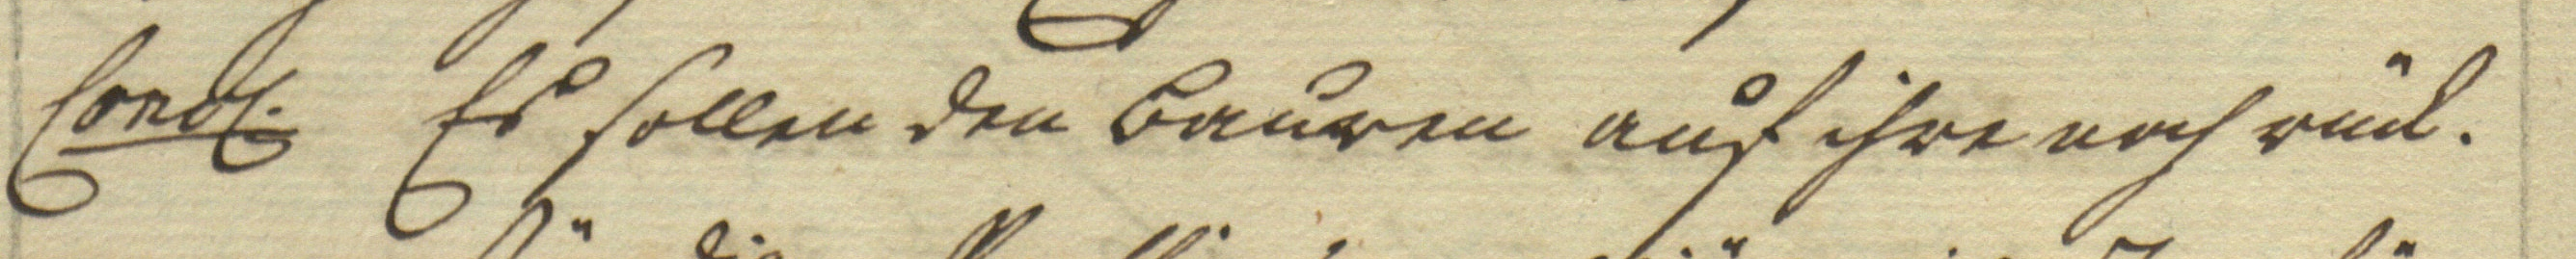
Concl., Es sollen den Bauren auf ihre noch rück¬
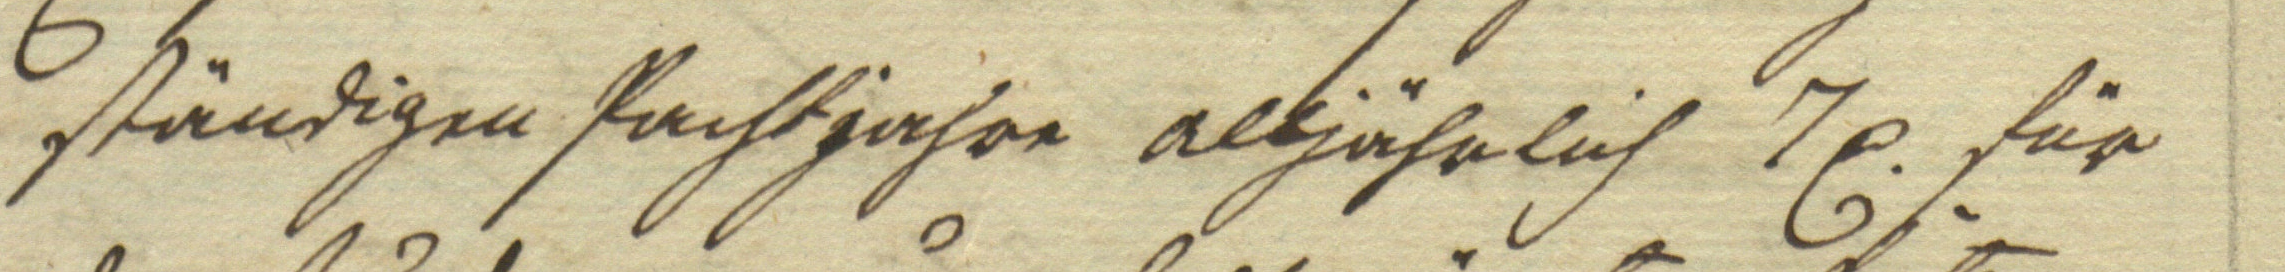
ständigen Pachtjahre alljährlich 7 l. für
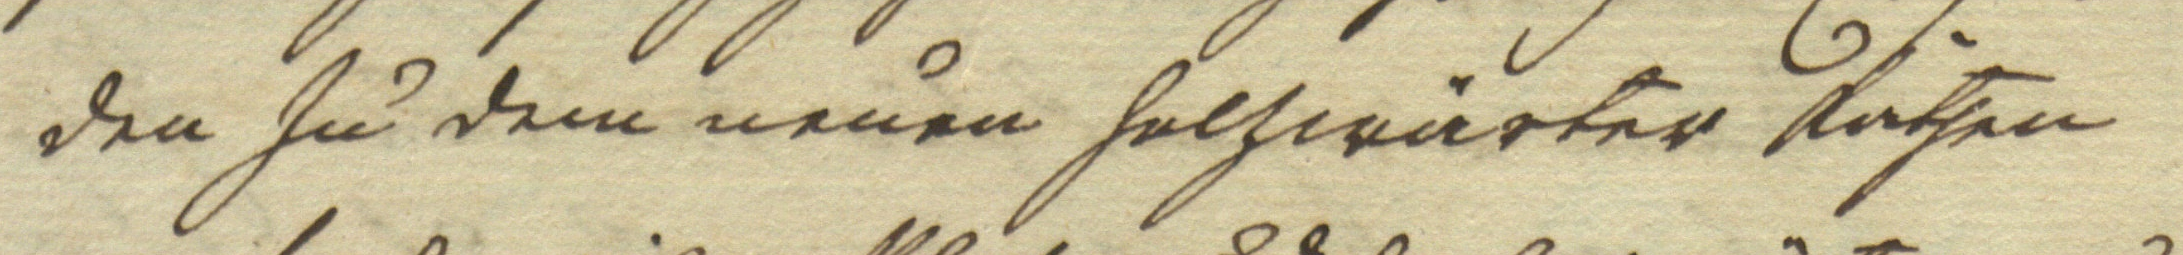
den zu dem neuen Holzwärter Kathen
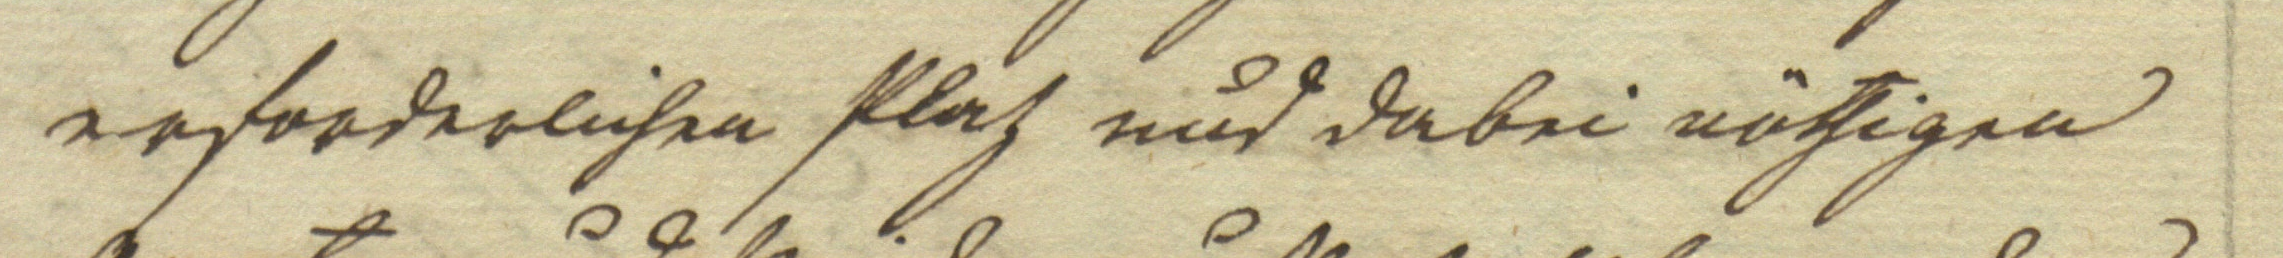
erforderlichen Platz und dabei nöthigen
